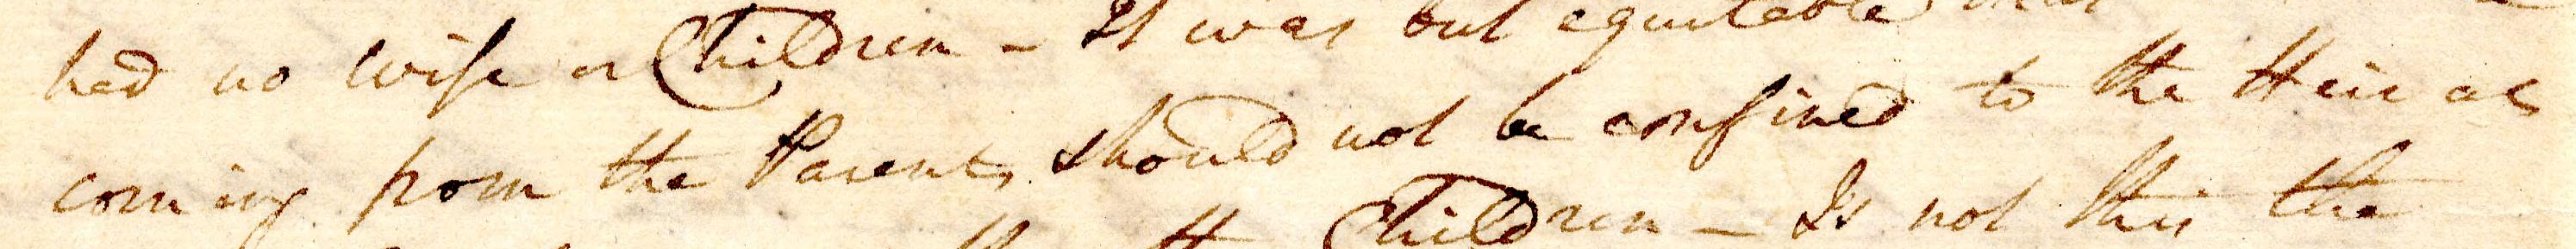coming from the Parent, should not be confined to the Heir as
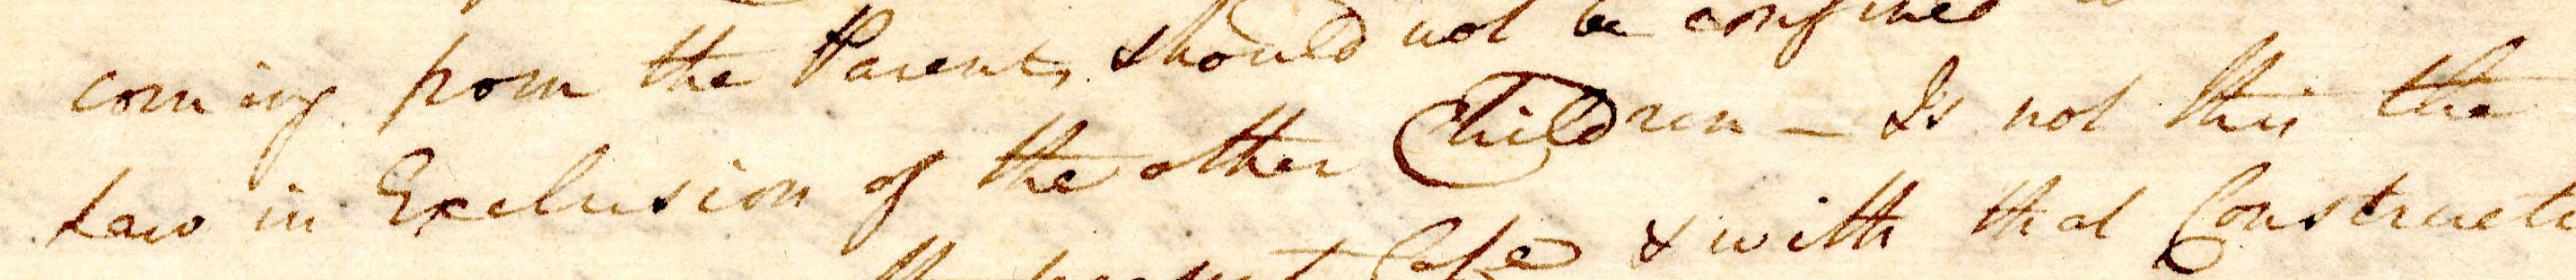Law in Exclusion of the other Children- Is not this the
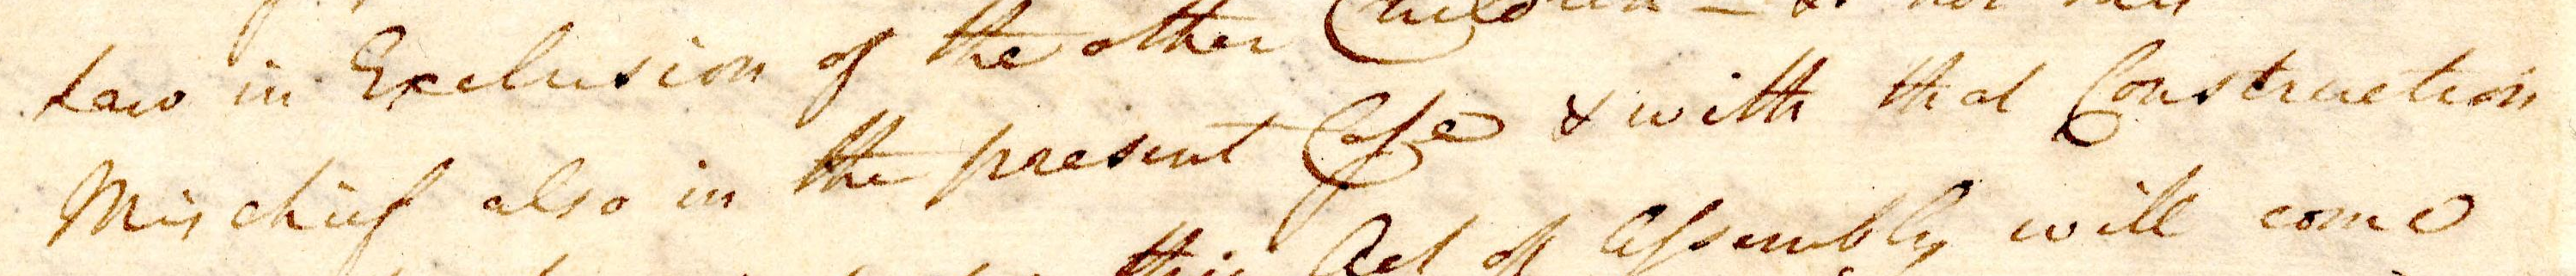Mischief also in the present Case & with that Construction
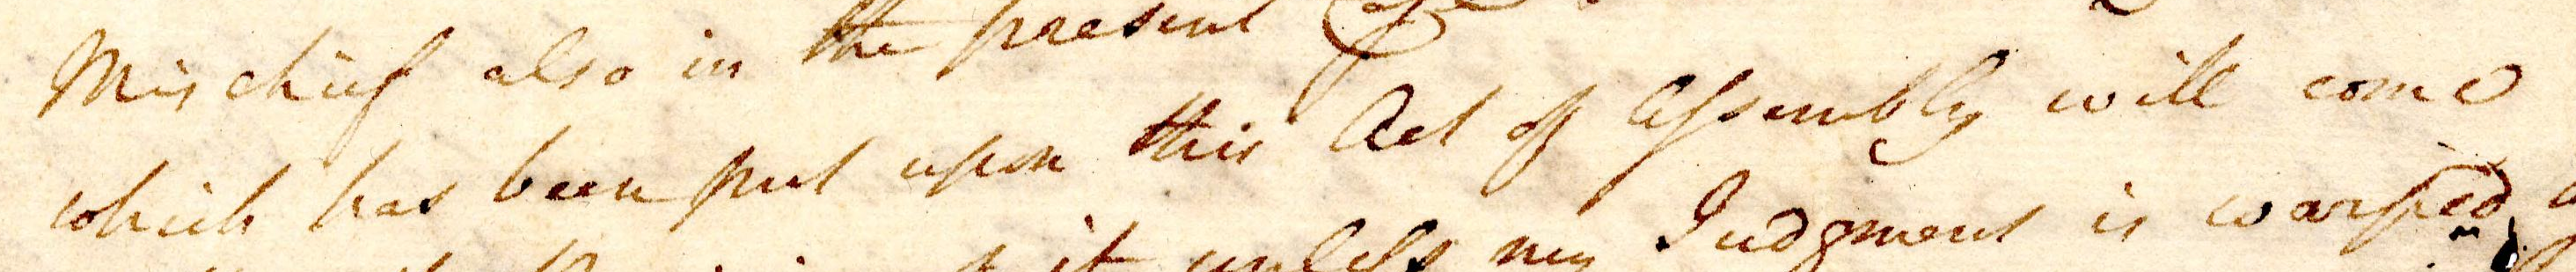which has been put upon This Act of Assembly will come
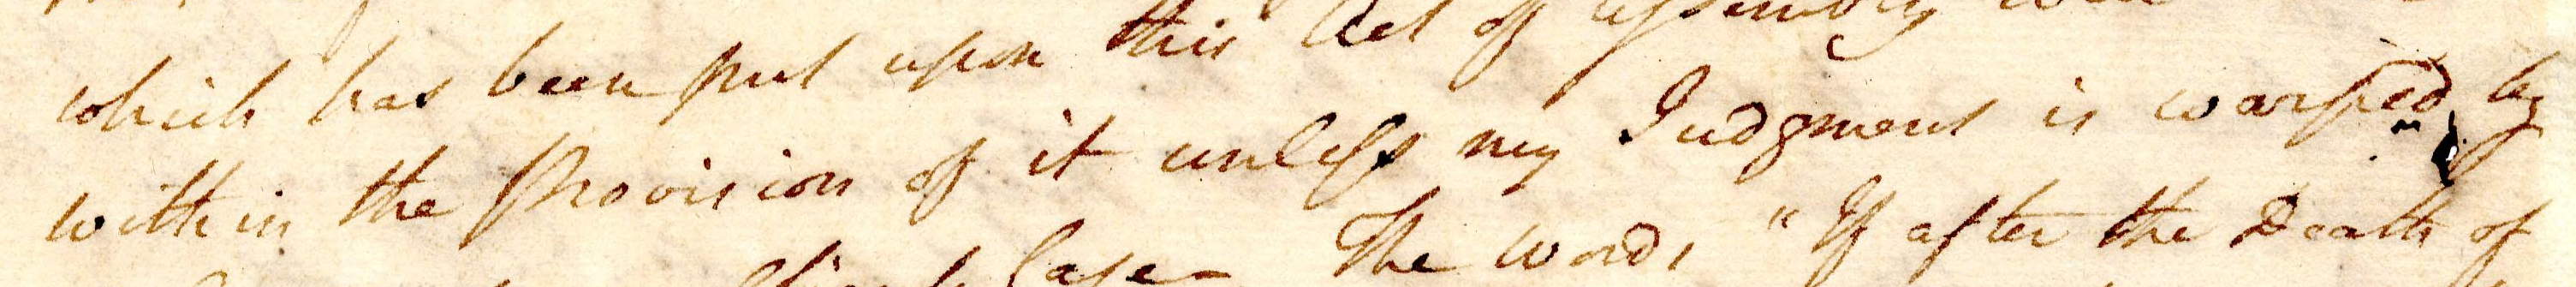within the Provision of it unless my Judgment is warped by
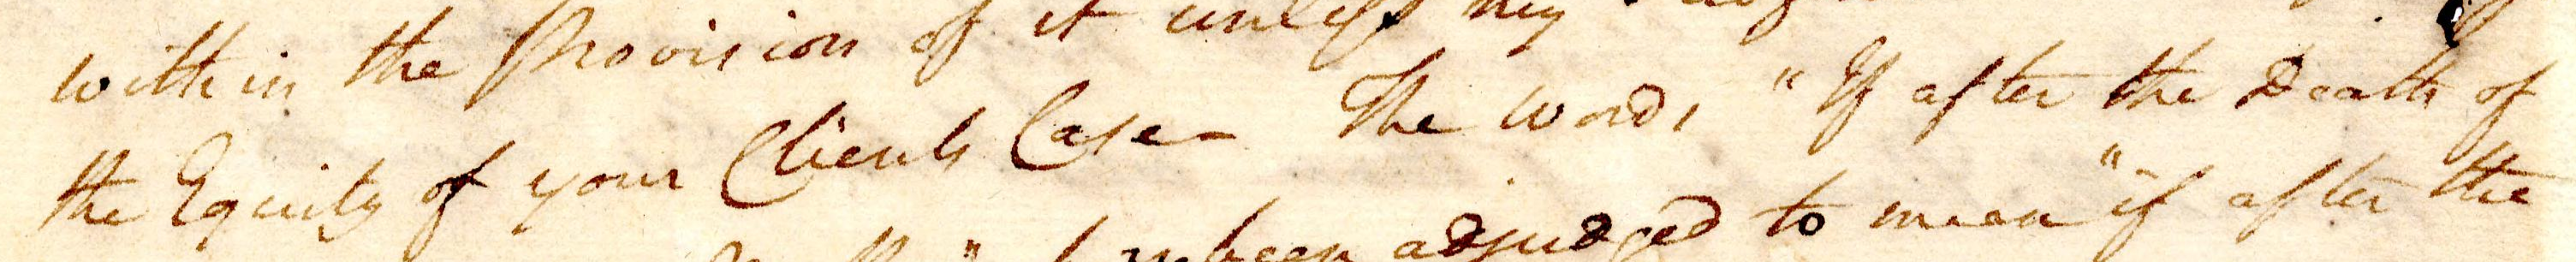the Equity of your Clients Case. The words "If after the Death of
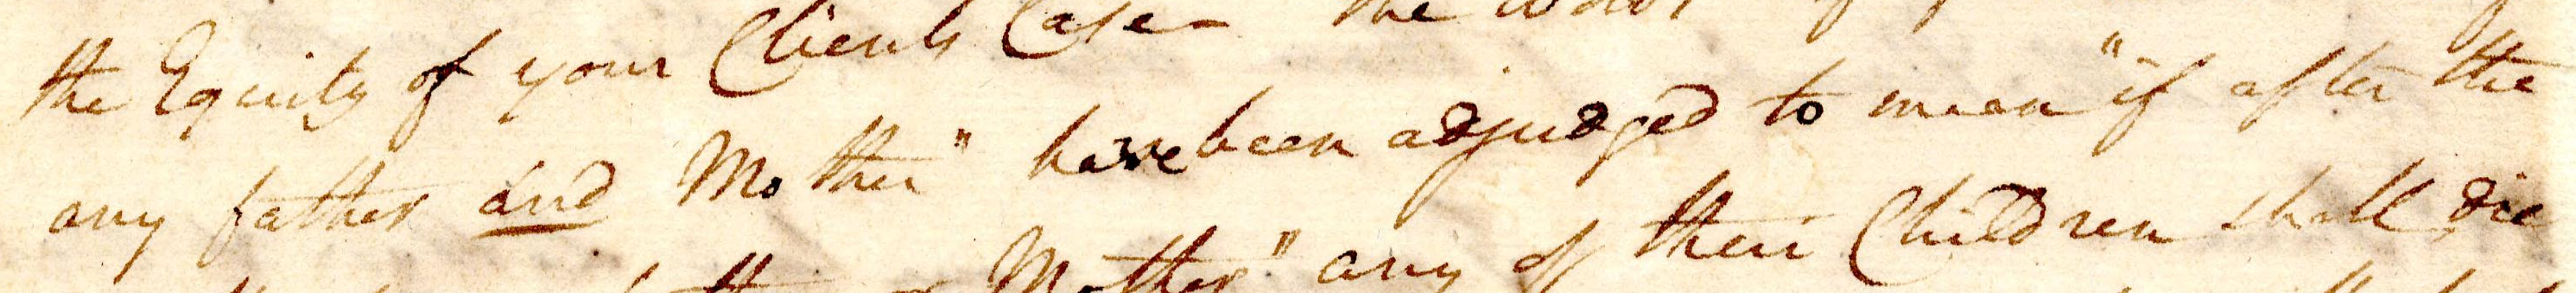any father and Mother" have been adjudged to mean "if after the
